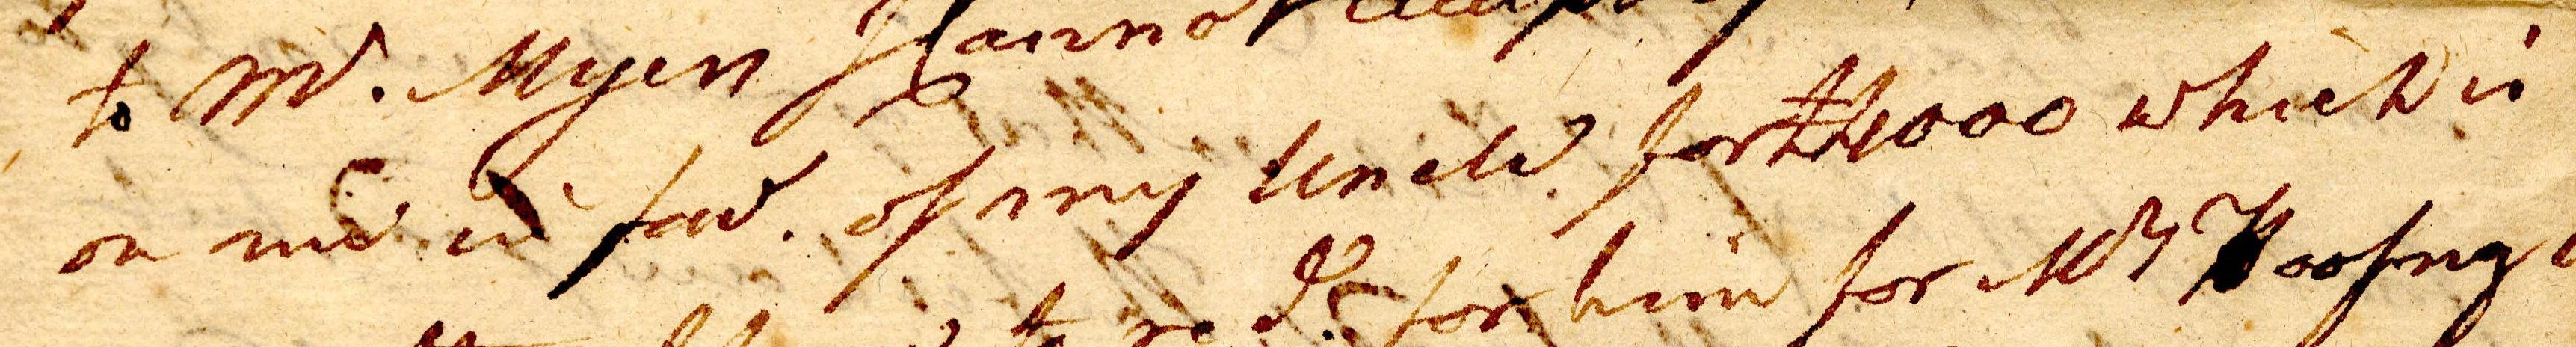on me in fav^r. of my Uncle for £4000 which is
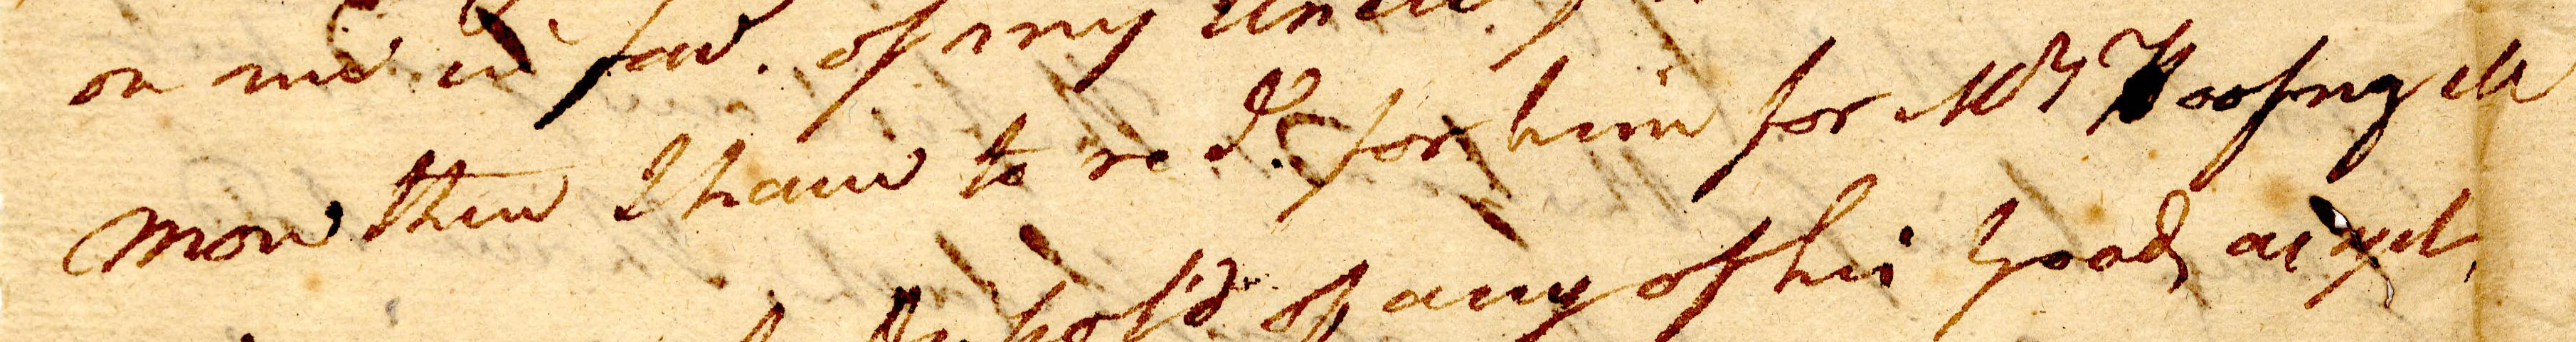more then I hauve to rec^d. for him for M^r Hoofngell
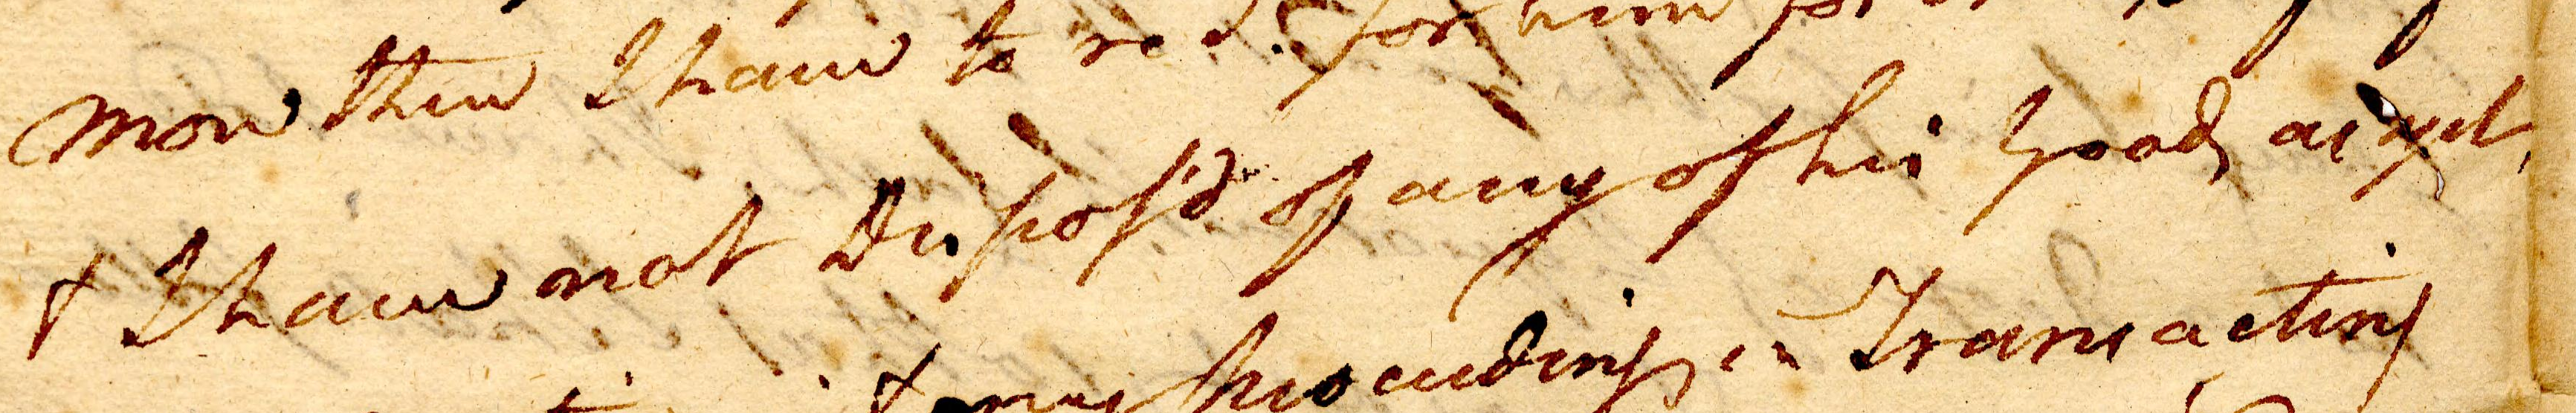& I have not Dispos'd of any of his Goods, as yet
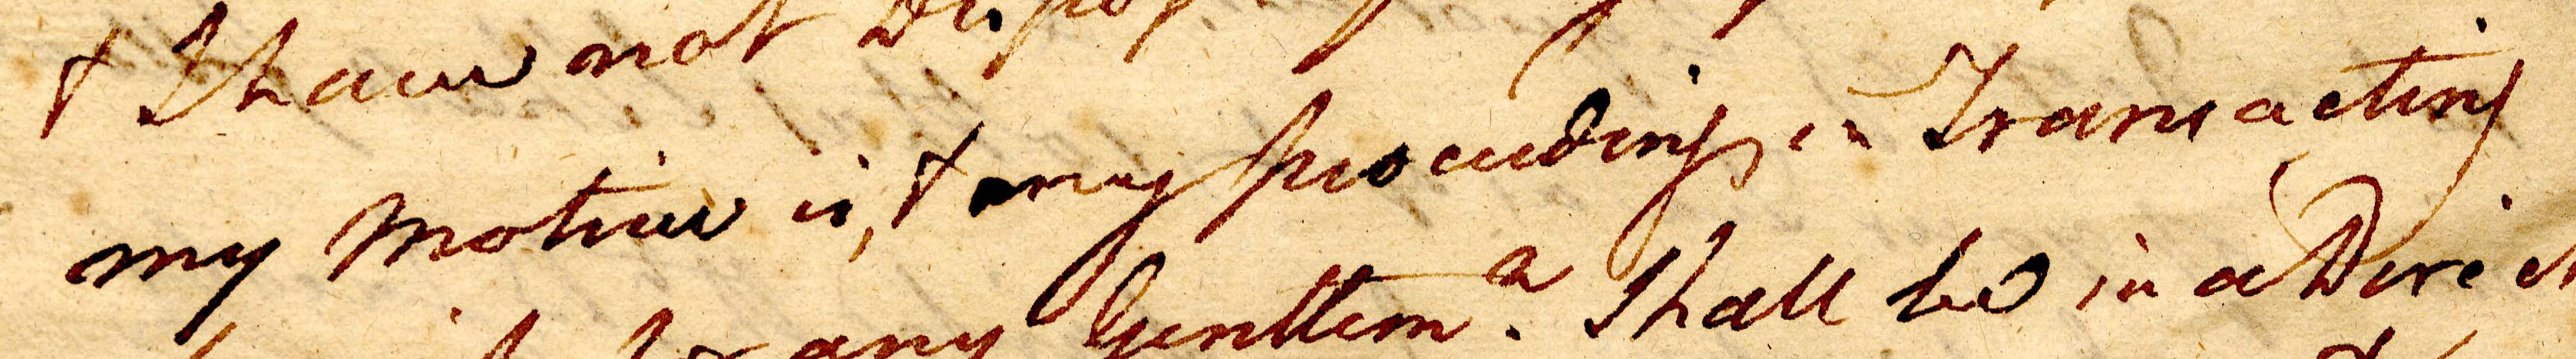my motive is, & any proceeding, Transacting
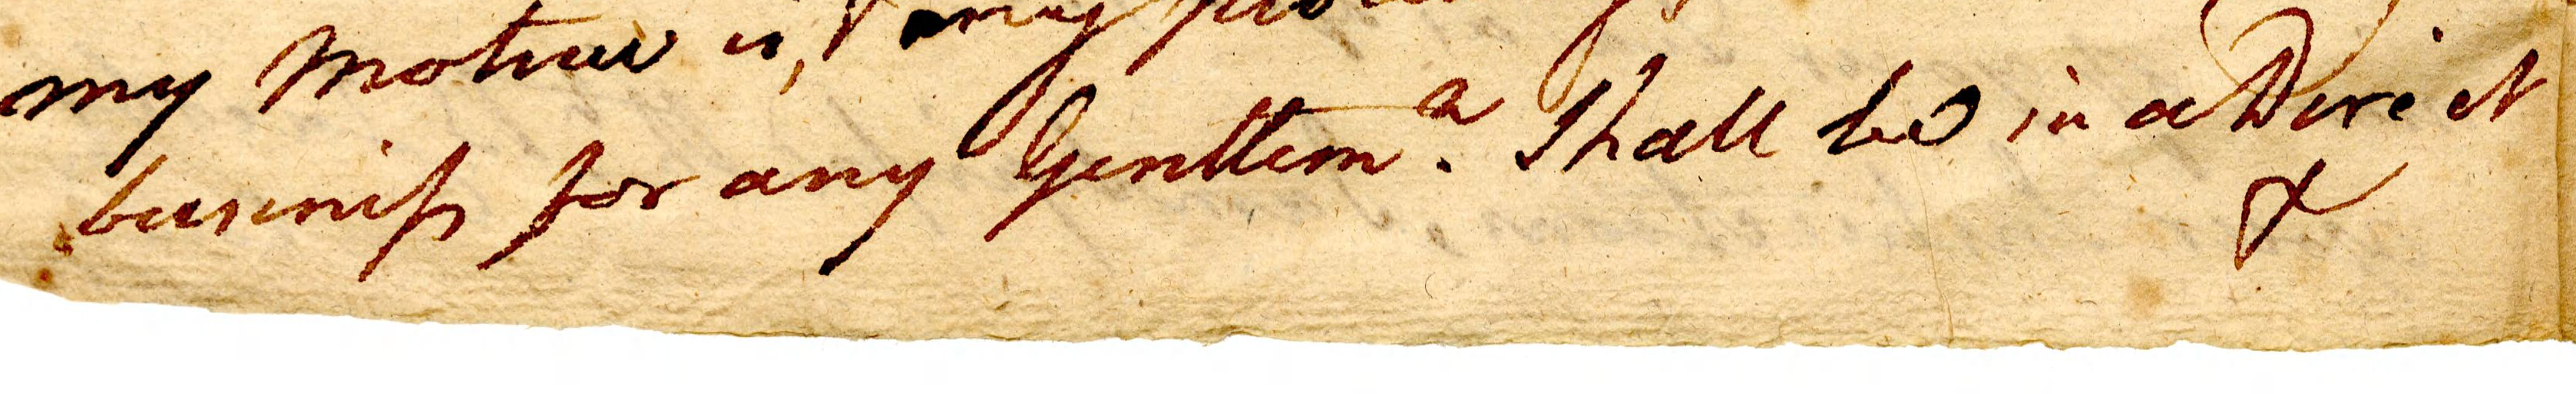business for any Gentlem^n. I shall be in a Direct
